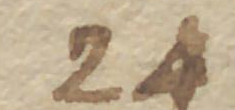24
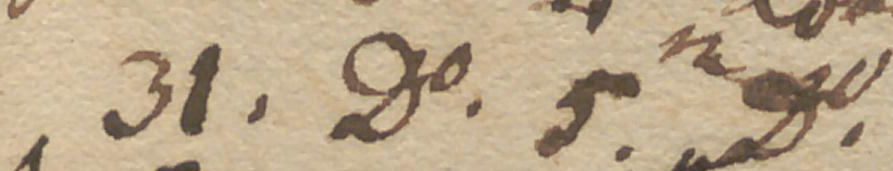31. D^o. 5^th. D^o.
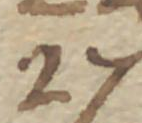27
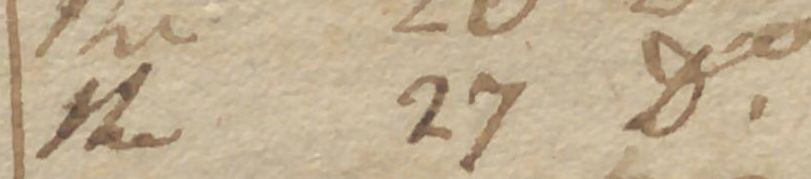the 27 D^o.
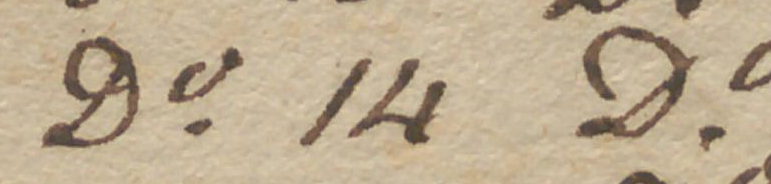D^o. 14 D^o.
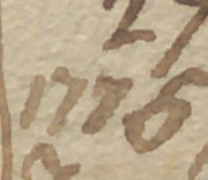1776
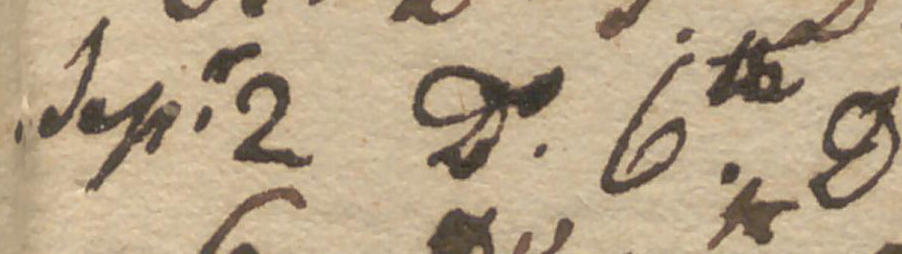Sep^r. 2 D^r. 6^th. D^o.
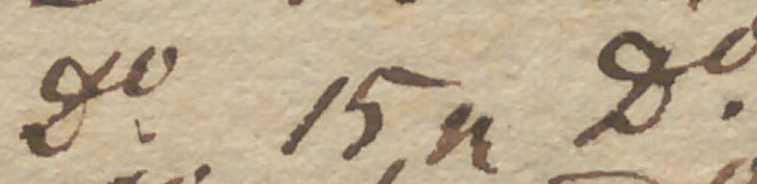D^o. 15th D^o.
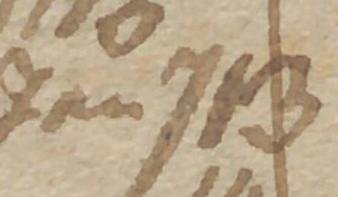Jan^y 13
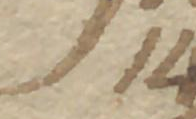14
